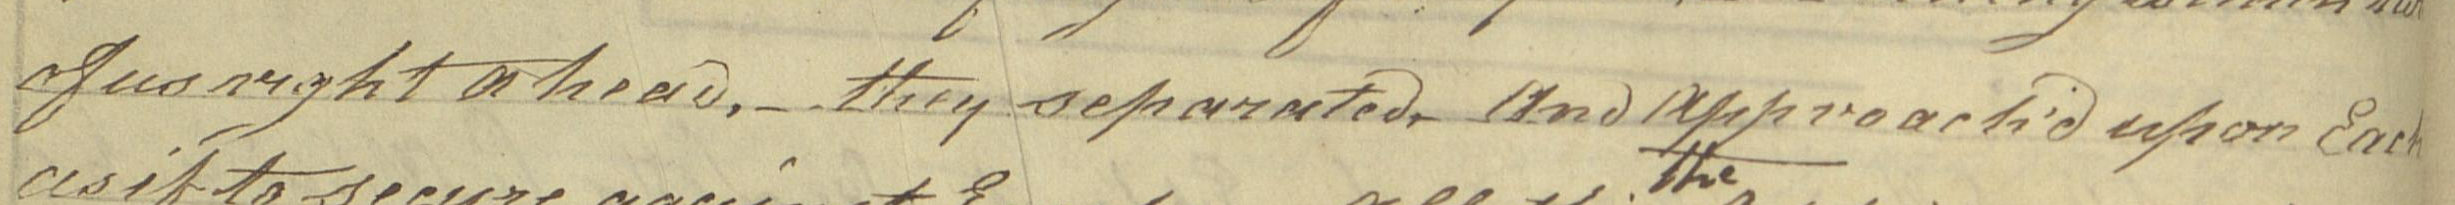of us right ahead, They separated, And approach'd upon Each
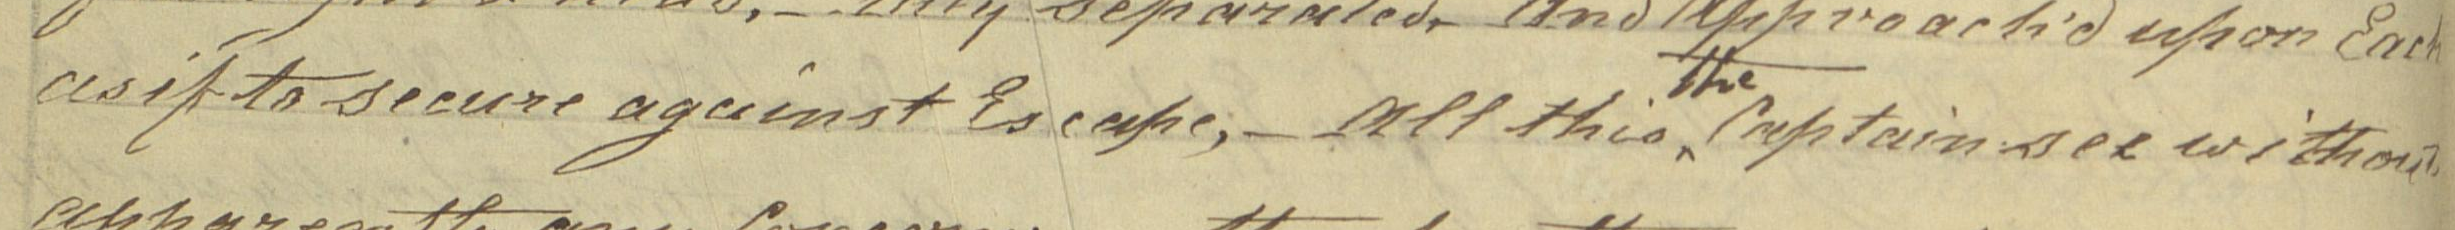as if to secure against Escape, All this ^ Captain see without
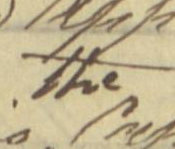the
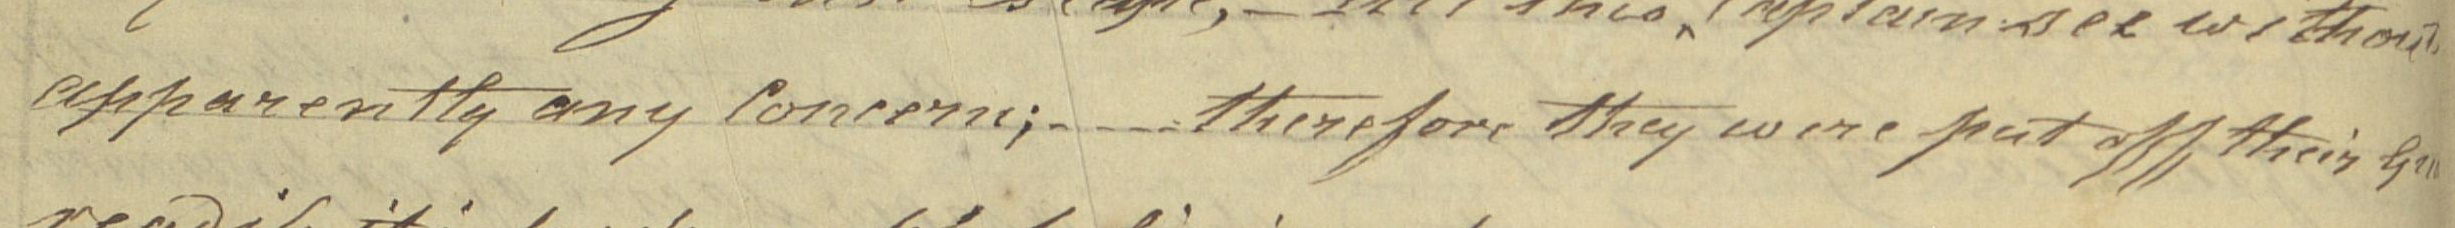apparently any Concern; therefore they were put off their G-
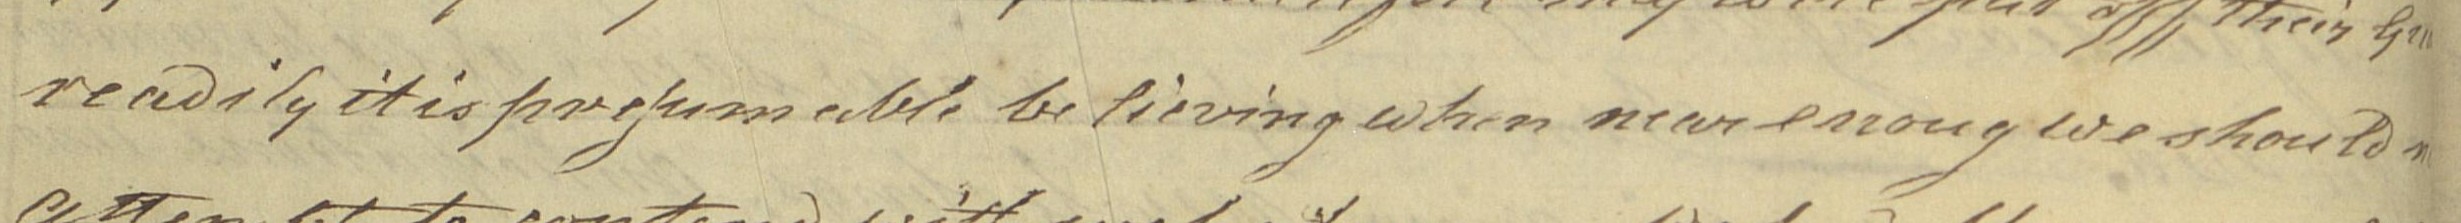readily it is presumable believing when near enoug we should
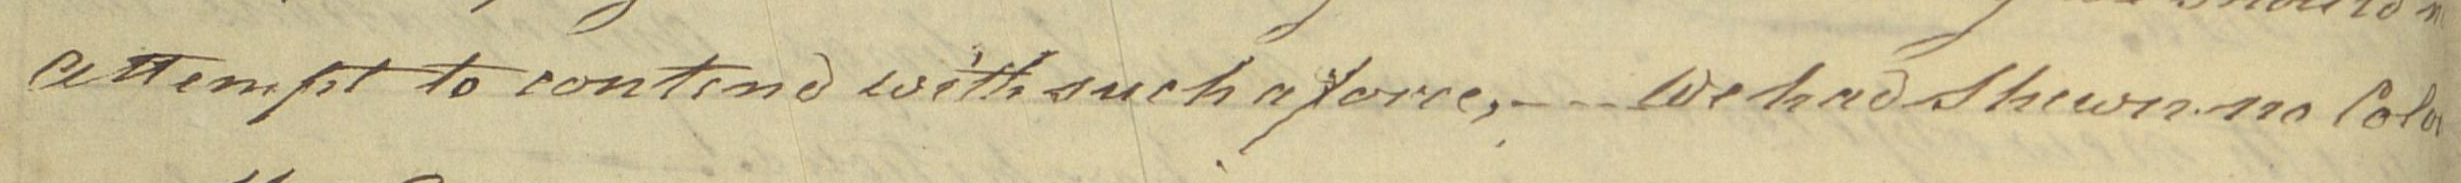attempt to contend with such a force, We had Shewn no Col-
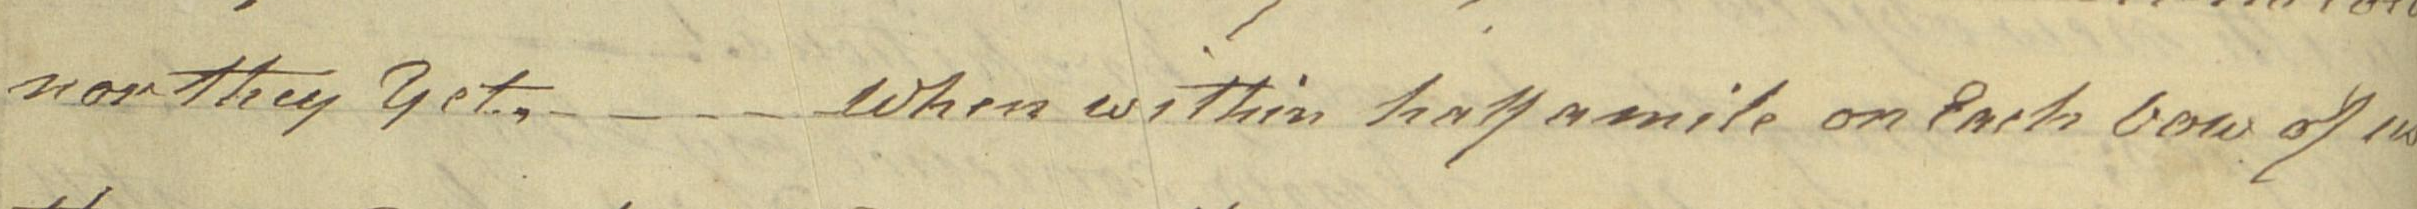nor they Yet. When within half a mile on Each bow of us
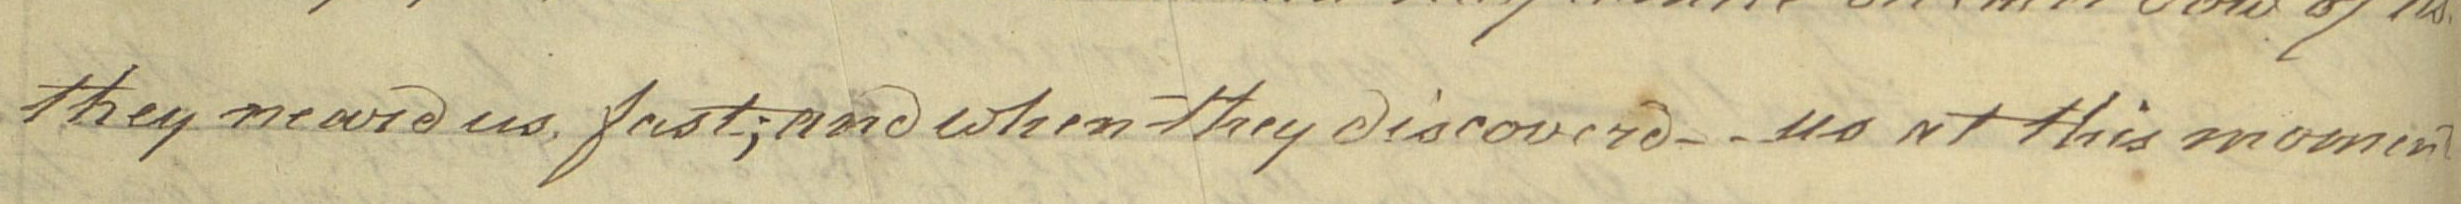they neard us fast; and when they discoverd us at this moment
